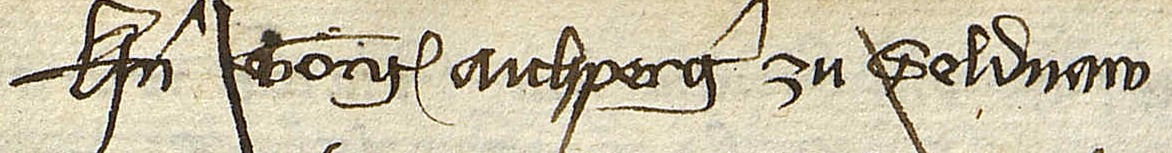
H*n Görg* aichperg* ʒu Seldnaw
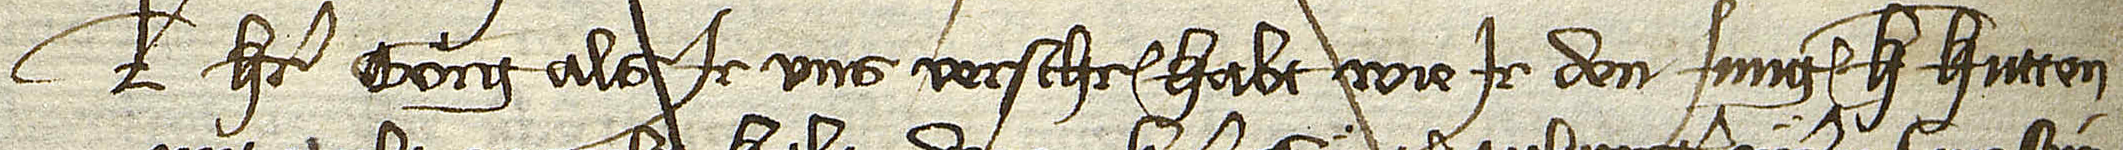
L* h*r Görg als Ir vns verſchr* habt wie Ir den Iung* . h* hutten
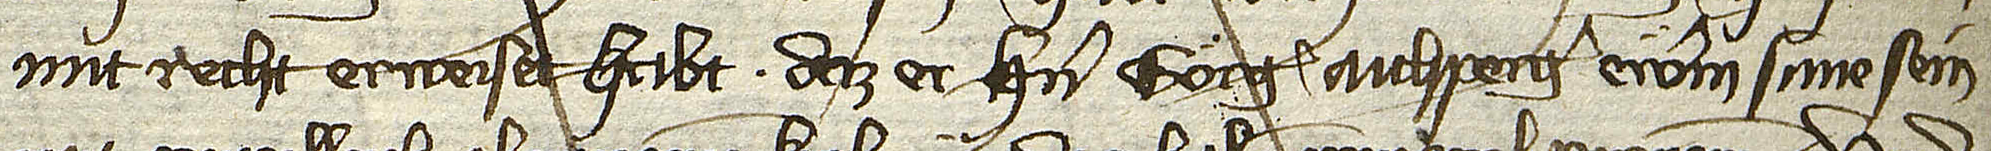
mit recht erweiſet habt . daʒ er h*n Görg* aichperg* ew*m ſune ſein
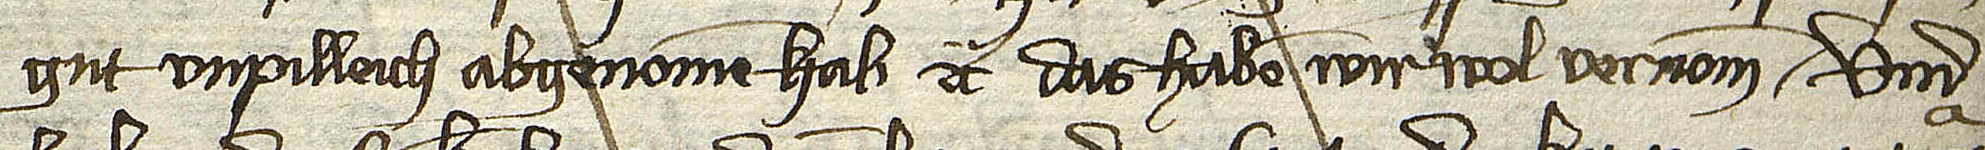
gut vnpilleich abgenome* hab ec* das habe* wir wol vernom* / Vnd
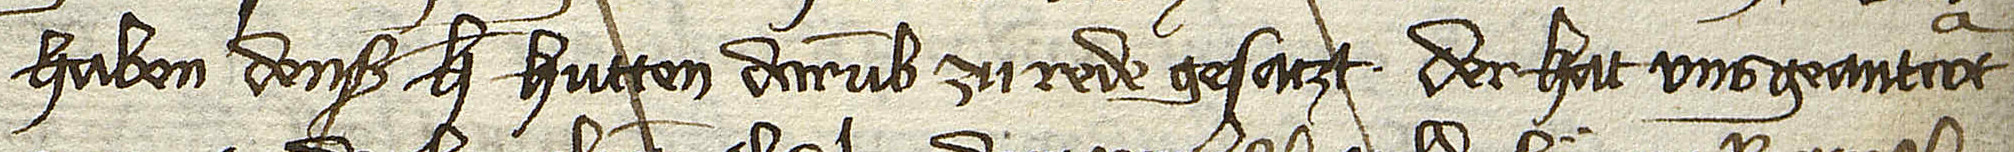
haben denſ* h* hutten daru*b ʒu rede geſacʒt . Der hat vns geantw*t
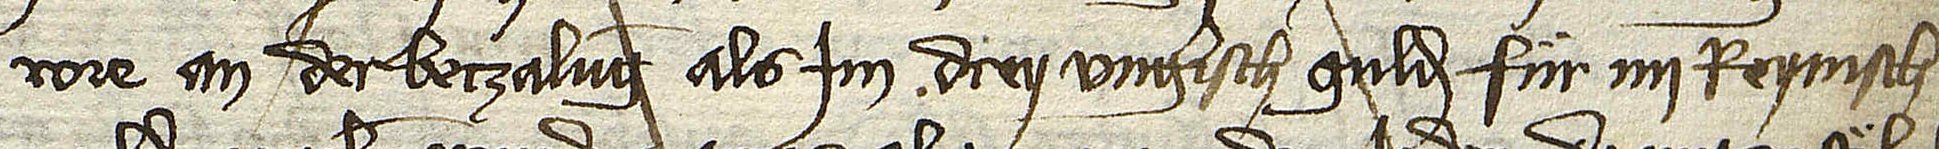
wie an der becʒalu*g als Im drey vng*iſch guld* für iiii Reyniſch
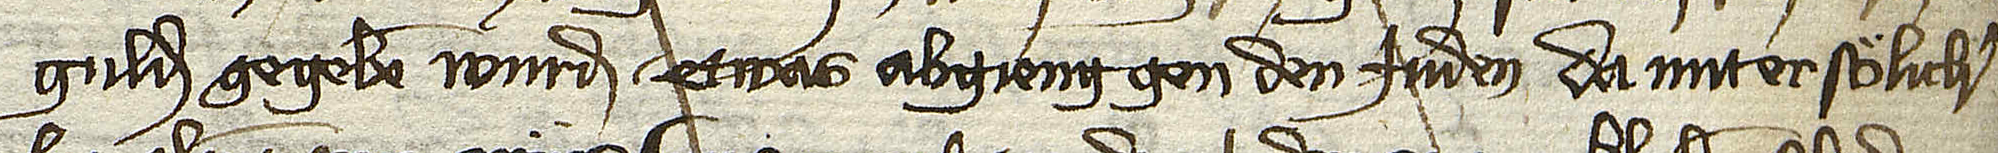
guld* gegebe* wurd* / etwas abgieng gen den Iuden da mit er ſölich*
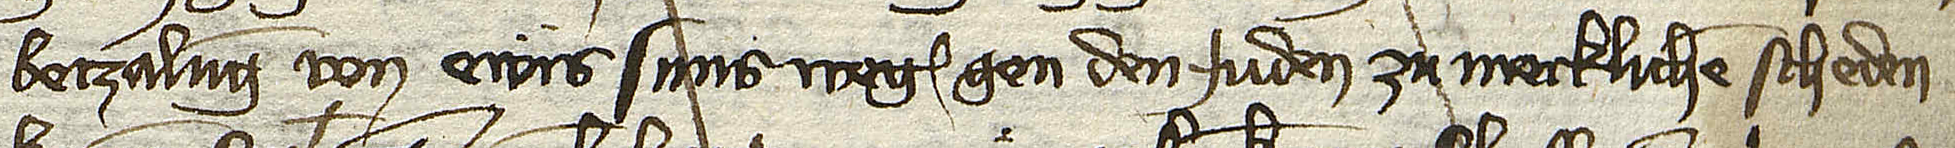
becʒalu*g von ewrs ſuns weg* gen den Iuden ʒu merkliche* ſcheden
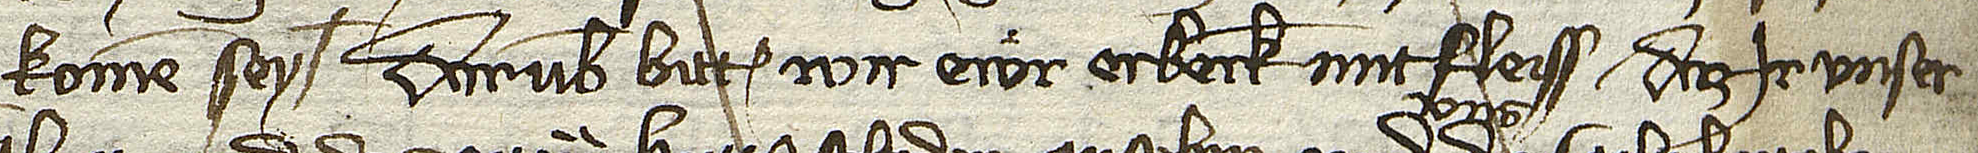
kome* ſey Daru*b bitt* wir ewr erberk* mit fleiſſ / daʒ Ir vnſer
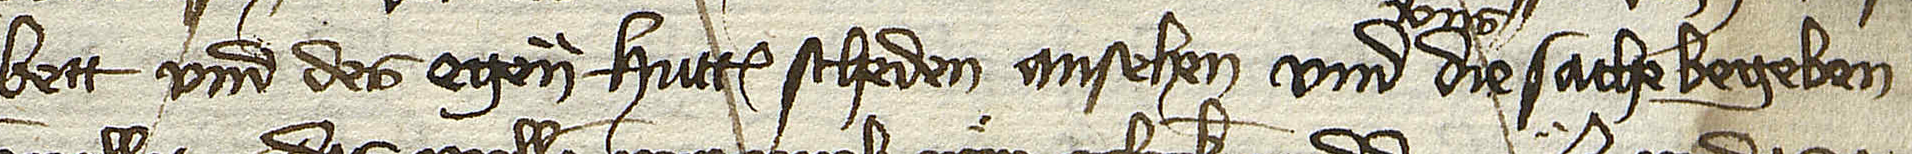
bett vnd des egen* Hutt* ſcheden anſehen vnd die ſache begeben
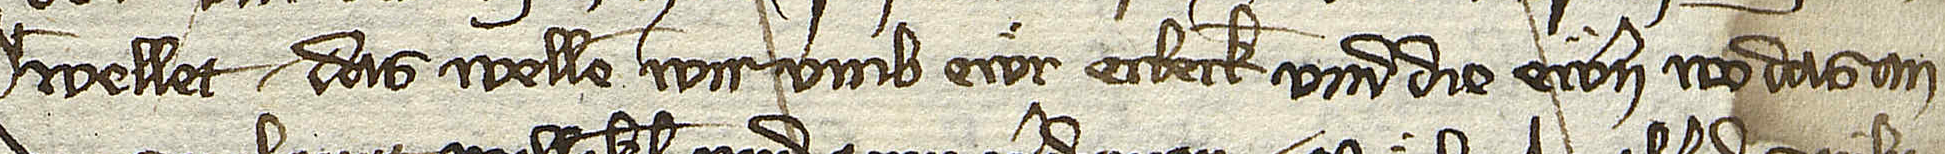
wellet / das welle* wir vmb ewr erberk* vnd die ew*n wo das an
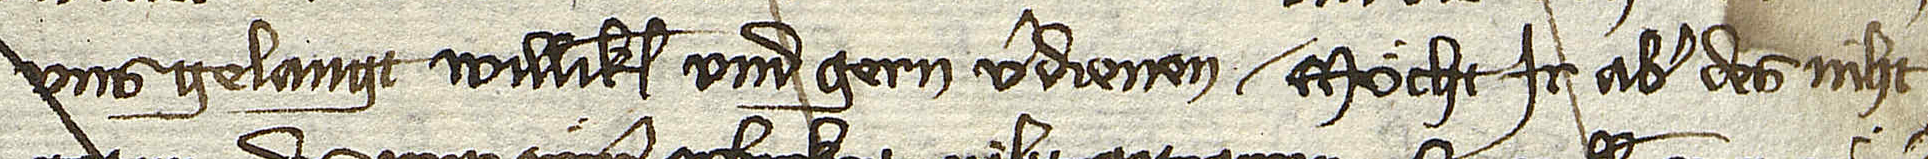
vns gelangt willikl* vnd gern v*dienen . / Möcht Ir ab* des niht
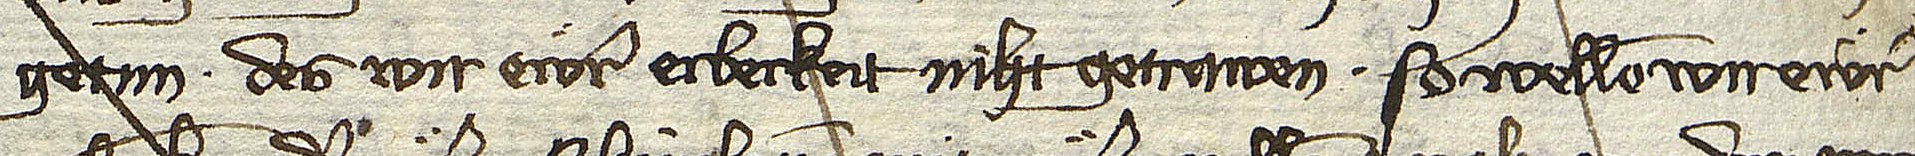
getun . des wir ew*r erberkeit niht getrawen . ſo welle* wir ew*r
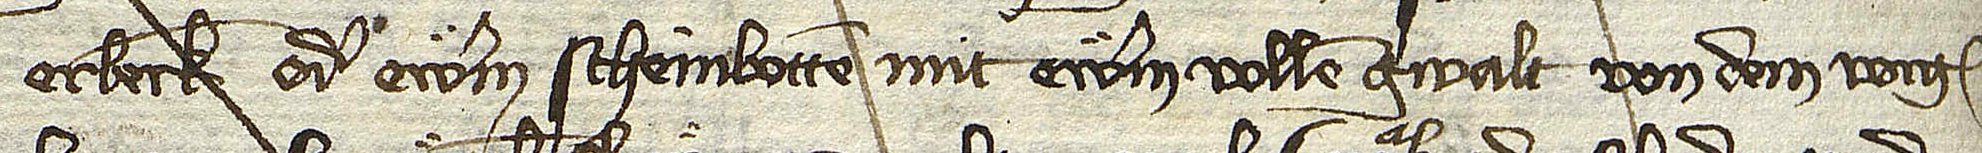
erberk* od* ew*m ſcheinbotte* mit ew*m volle* gwalt von dem vorg*
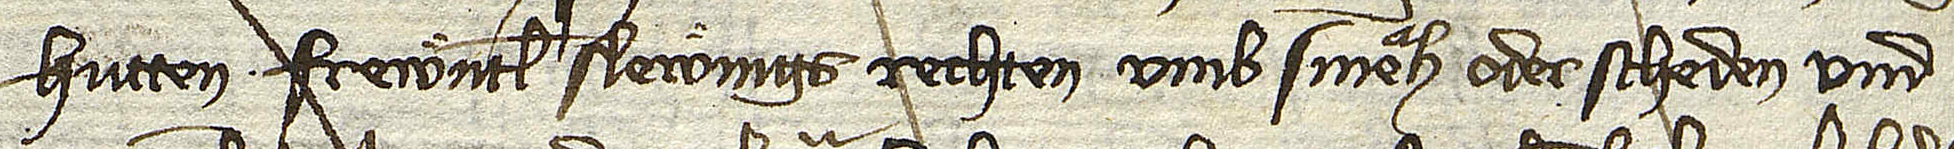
hutten . frewntl* ſlewnigs rechten vmb ſmëh oder ſcheden vnd
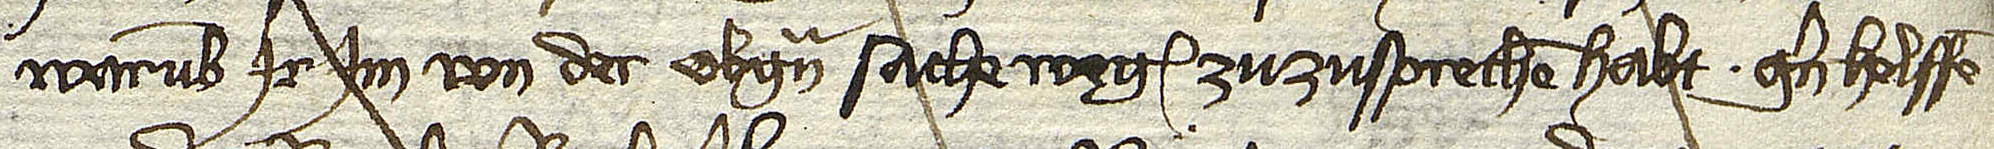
waru*b Ir Im von der Obg*n ſache weg* ʒuʒuſpreche* habt . g*n helffe*
